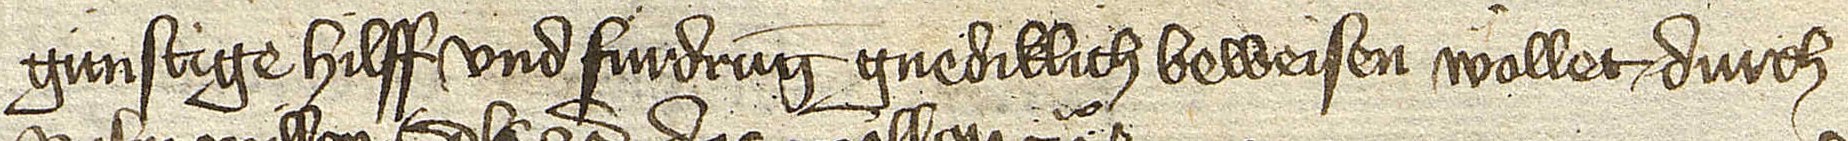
günſtige hilff vnd fürdrug* gnediklich beweiſen wöllet / durch
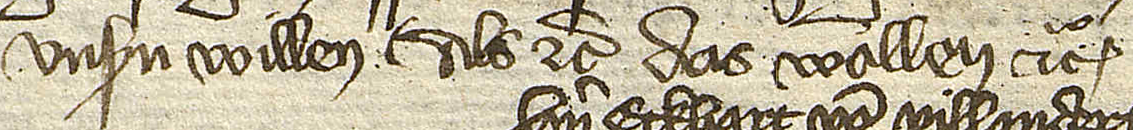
vnſ*n willen / Als ec* das wöllen ec*
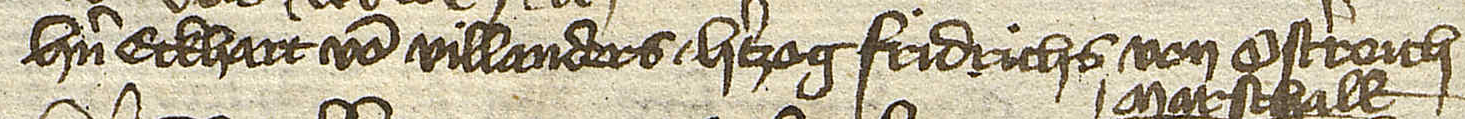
hn* Erkhart vo* villanders / h*cʒog fridrichs von Oſt*reich
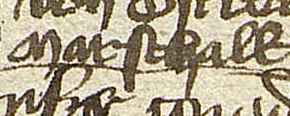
Marſchall*
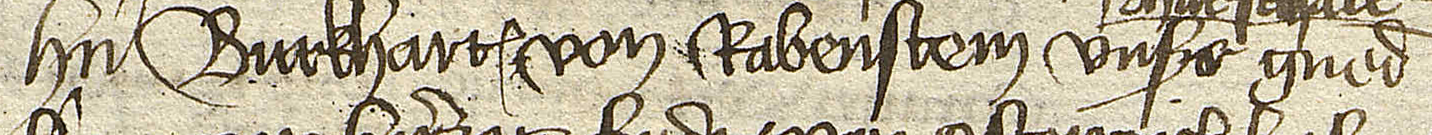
hn* Burkhart* von Rabenſtein vnſ*s gned*
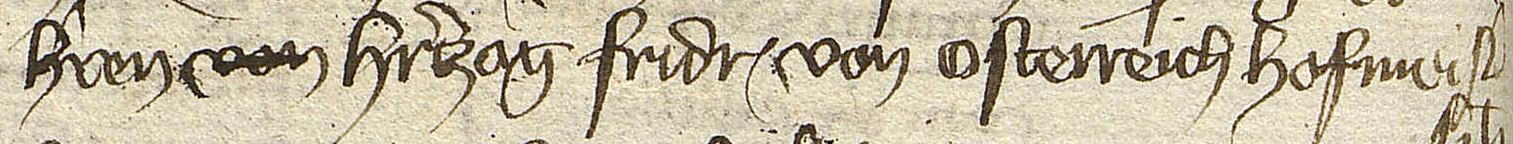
h*ren von hr*cʒog fridr* von Oſterreich hofmeiſt*
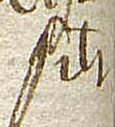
ſilr*
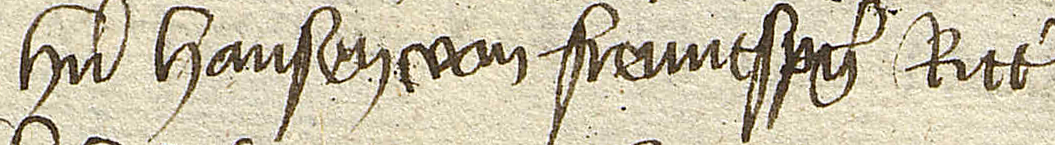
hn* hanſen von freuntſpg* Ritt*
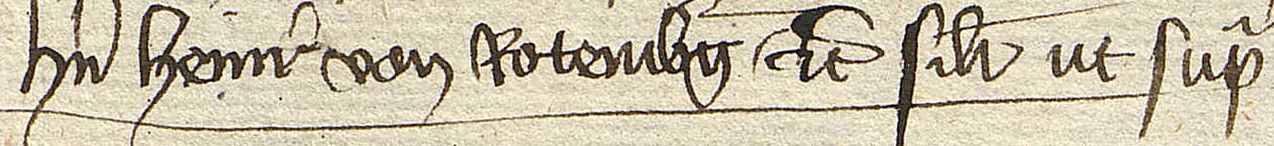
hn* heinr* von Rotembg* / ec* ſilr* ut ſup*
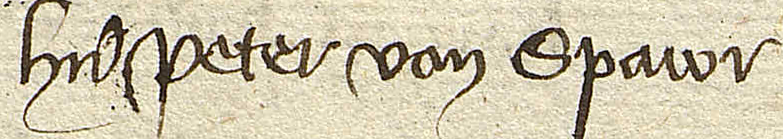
hn* Peter von Spawr
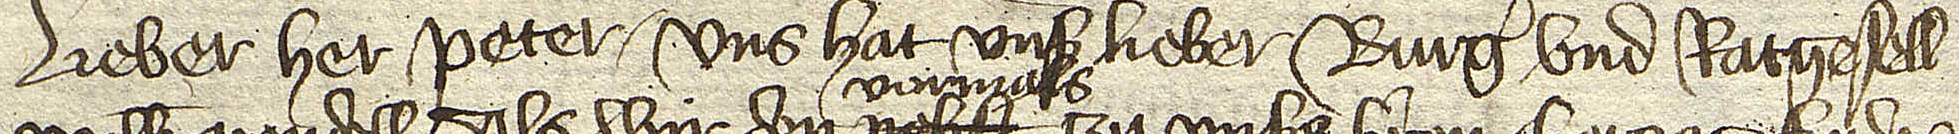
Lieber her Peter / vns hat vnſ* lieber Burg* vnd Ratgeſell
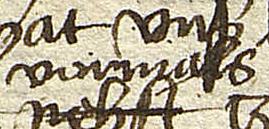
vormals
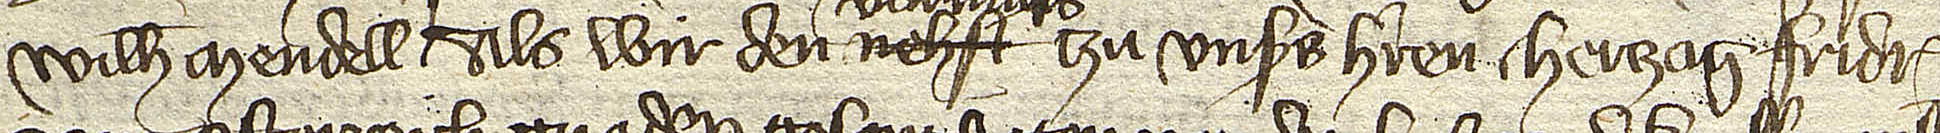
wilh* Mendell / Als wir den nehſt cʒu vnſ*s h*ren / hercʒog fridr*
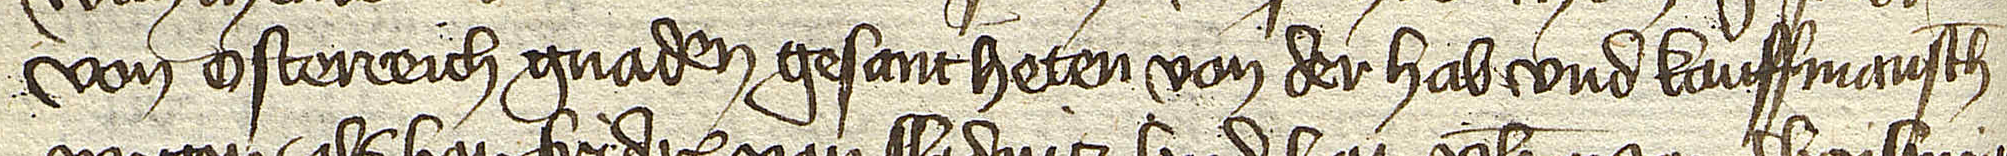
von Oſterreich gnaden geſant heten von der hab vnd kauffmanſch*
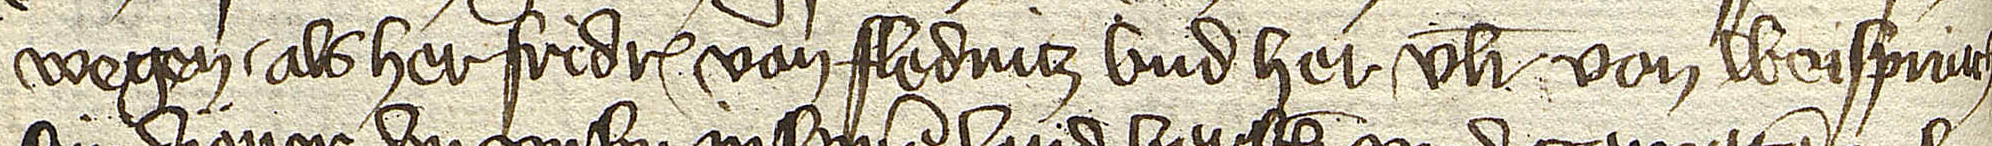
wegen / als her fridr* von flednicʒ vnd her vlr* von weiſpriach
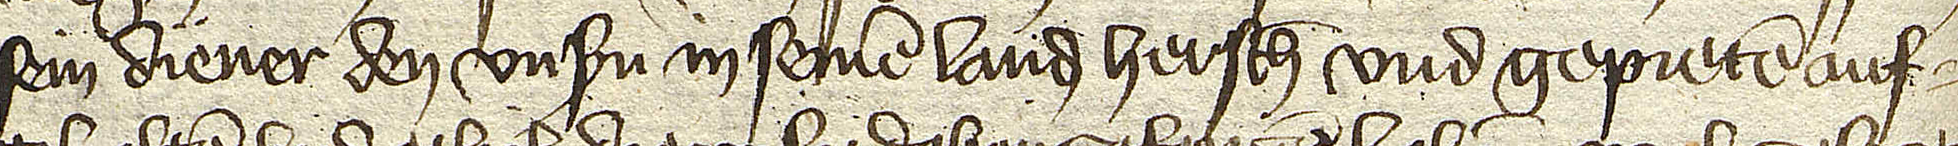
ſein diener den vnſ*n in ſeine* land herſch* vnd gepiete* auf =
